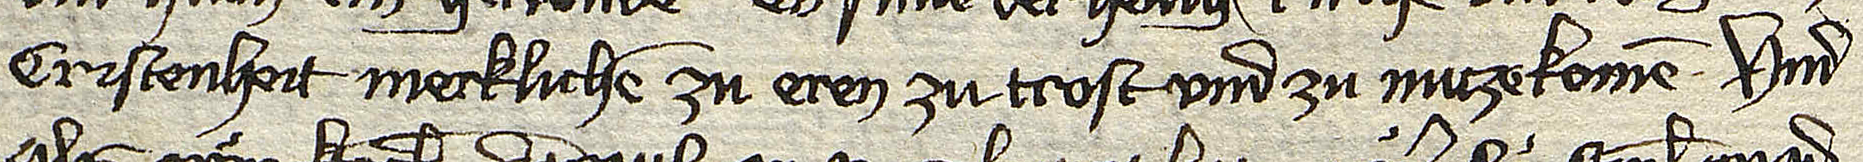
Criſtenheit merkliche* ʒu eren ʒu troſt vnd ʒu nucʒe kome* . Vnd
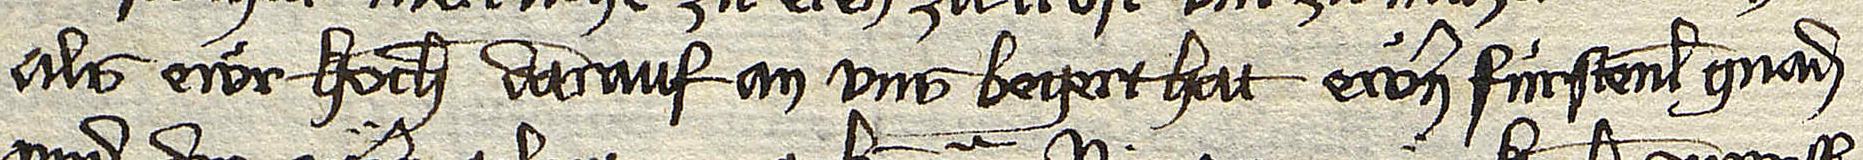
als ewr hoch* darauf an vns begert hat ew*n fürſtenl* gnad*
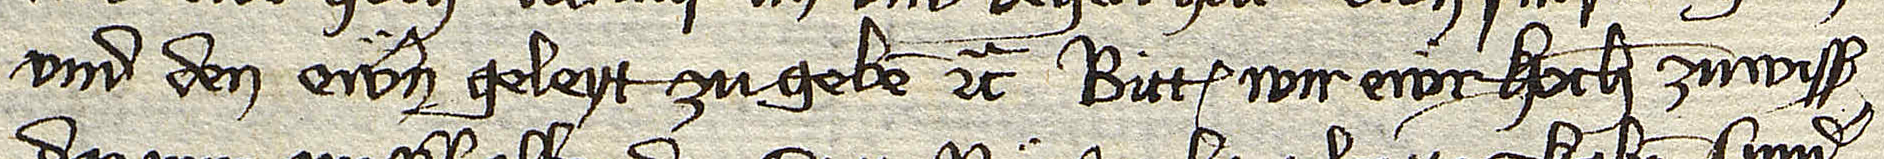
vnd den ew*n geleyt cʒu gebe* ec* Bitte* wir ewr hoch* ʒu wiſſ*
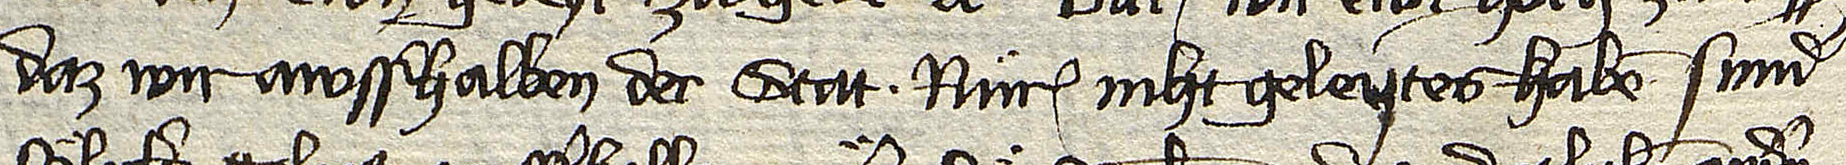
daʒ wir awſſ*halben der Stat . Nür* niht geleytes habe* ſund*
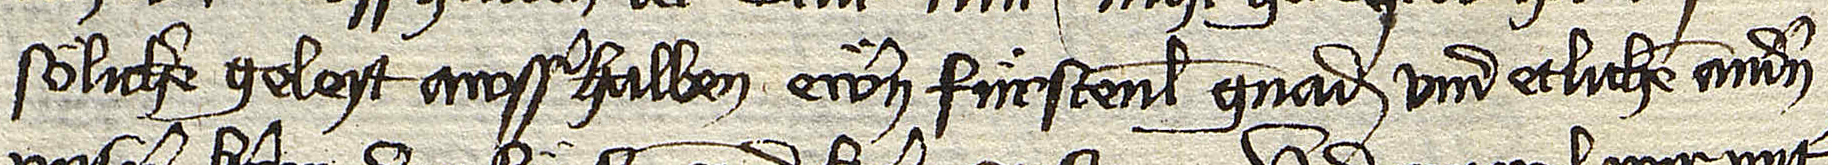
ſöliche geleyt awſſ*halben ew*n fürſtenl* gnad* vnd etliche* andn*
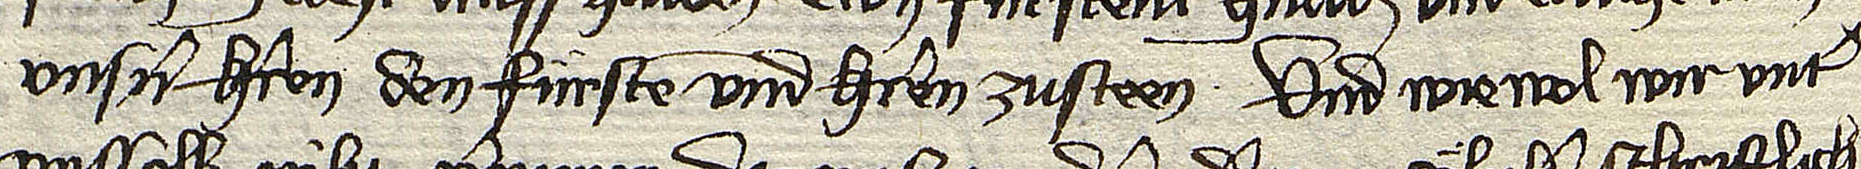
vnſn* h*ren den fürſte* vnd h*ren ʒuſteen . Vnd wie wol wir vnt*
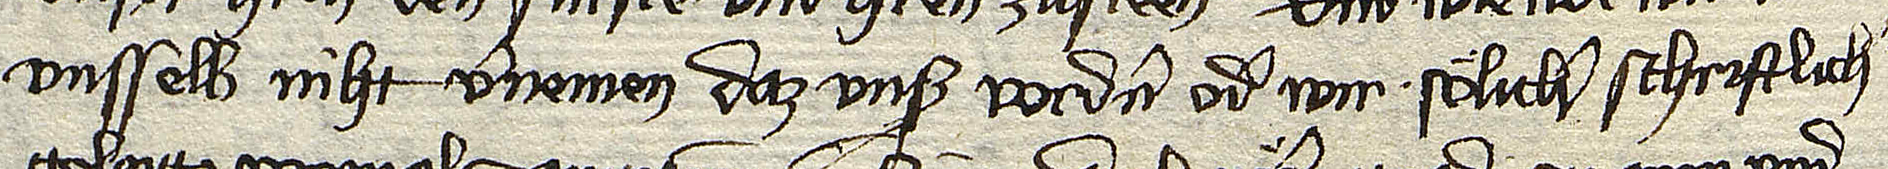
vnſſelb niht v*nemen daʒ vnſ* vord*n od* wir . ſölich* ſchriftlich*
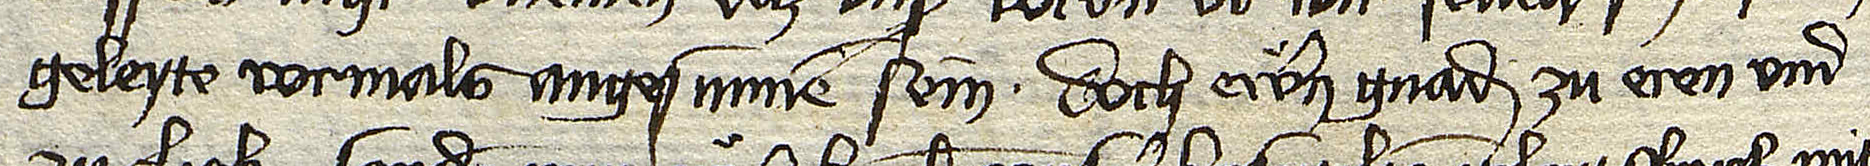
geleyte vormals angeſunne* ſein . Doh ew*n gnad* ʒu eren vnd
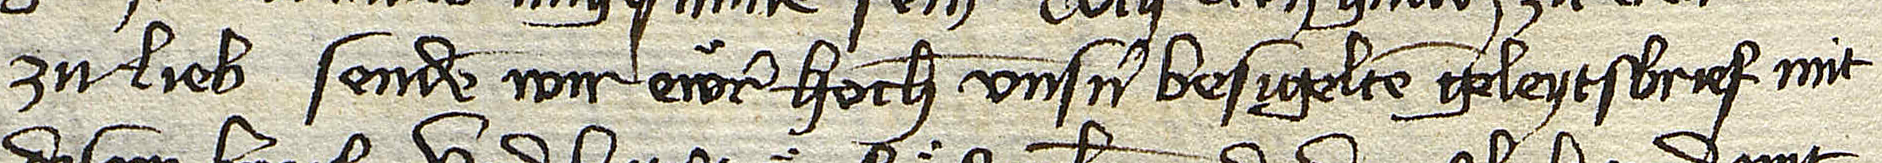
ʒu lieb ſende* wir ewr* hoch* vnſ*n beſigelte* geleytſbrief mit
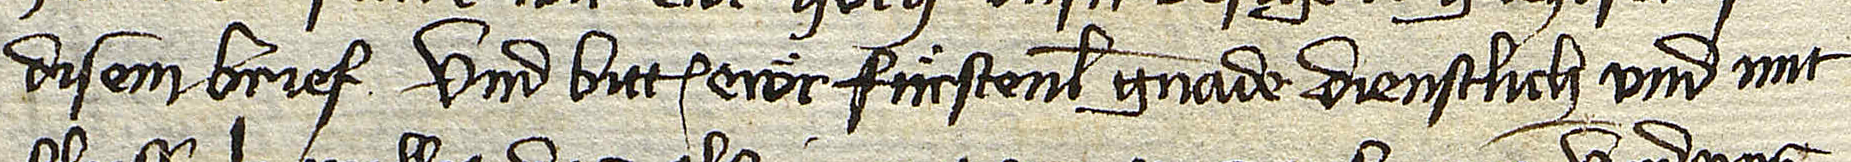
diſem brief Vnd bitt* ewr fürſtenl* gnade dienſtlich vnd mit
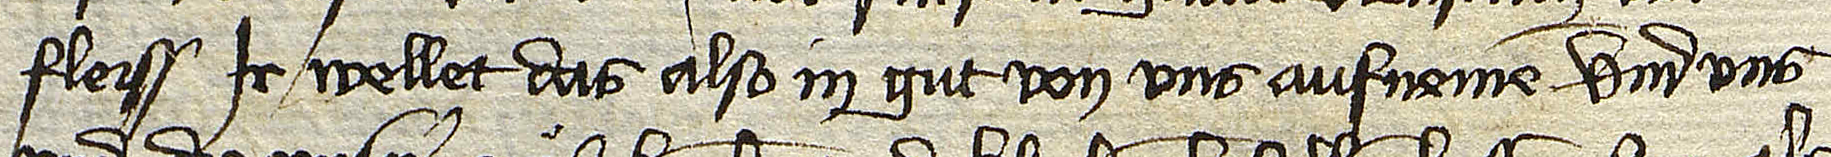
fleiſſ Ir wellet das alſo in gut von vns aufneme* Vnd vns
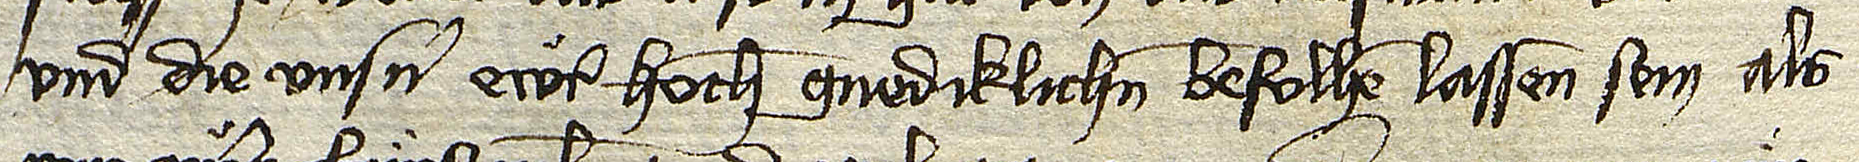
vnd die vnſn* ewr hoch* gnediklich*n befolhe* laſſen ſein als
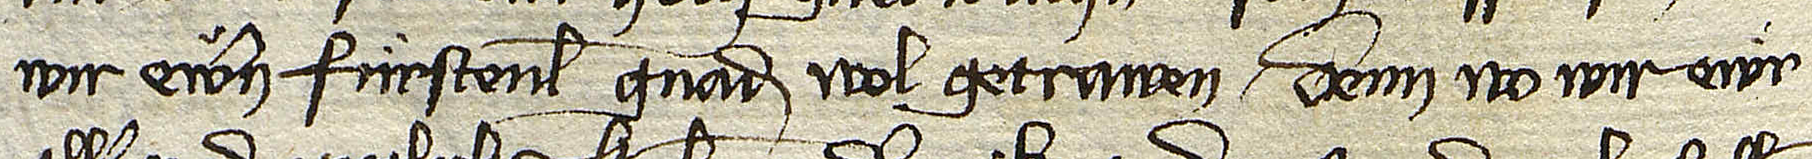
wir ew*n fürſtenl* gnad* wol getrawen / Denn wo wir ewr
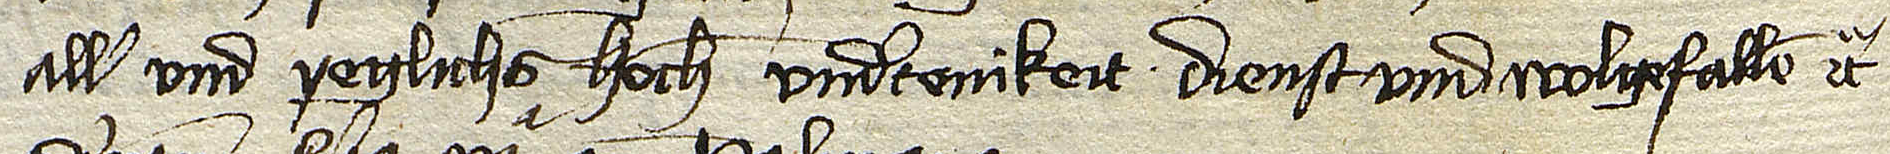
all* vnd yeglichs hoch* vnd*tenikeit . dienſt vnd wolgefalle* ec*
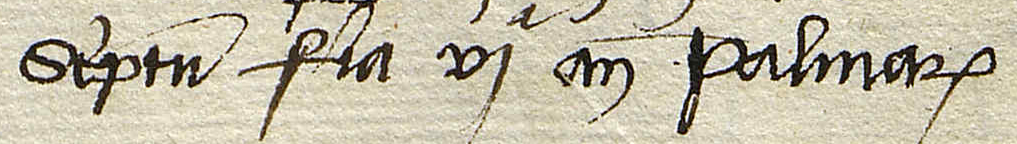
Sc*ptu* f*ia vi* an* Palma*
